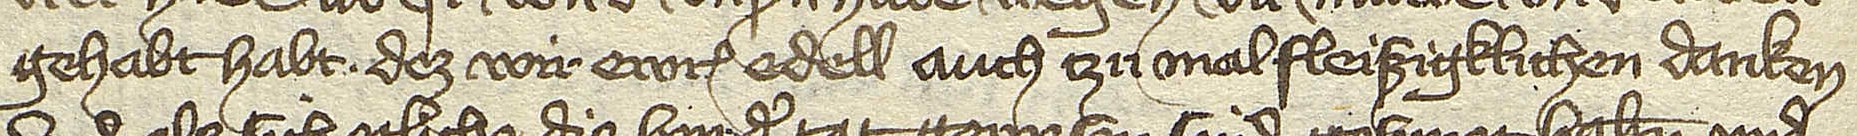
gehabt habt deʒ wir ewr* edell auch cʒu mal fleiſʒiklichen danken
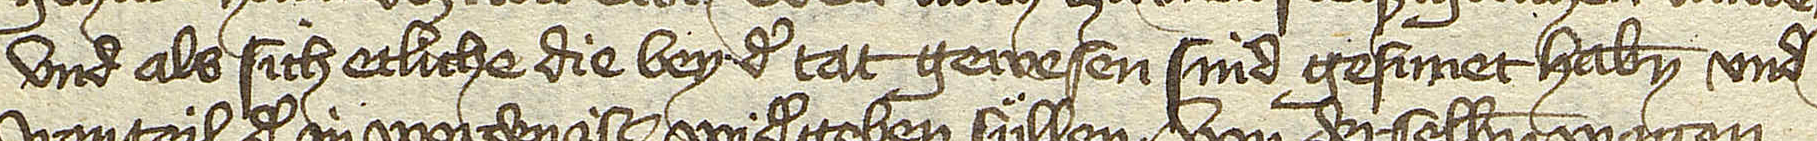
vnd als ſich etliche die bey d* tat geweſen ſind geſumet habn* vnd
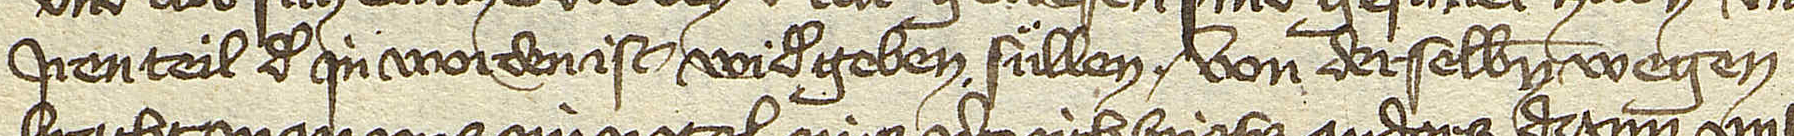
Iren teil d* in worden iſt wid* geben ſüllen . / von derſelbn* wegen
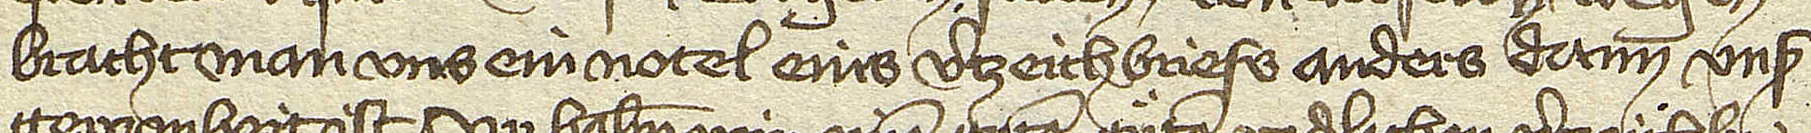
bracht man vns ein notel eins v*cʒeichbriefs anders dann vnſ*
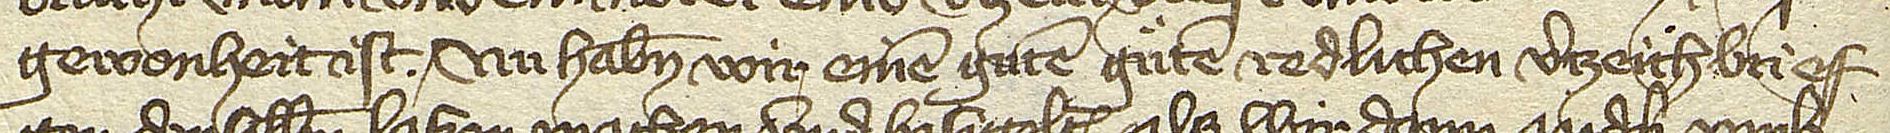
gewonheit iſt . / Nu habn* wir eine* güte* redlichen v*cʒeichbrief
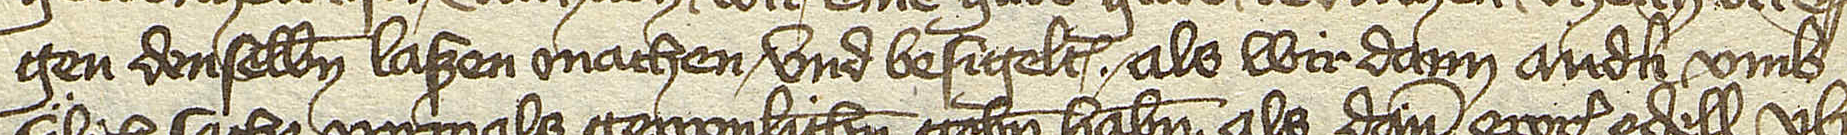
gen denſelbn* laſʒen machen / vnd beſigelt*. / als wir dann andn* vmb
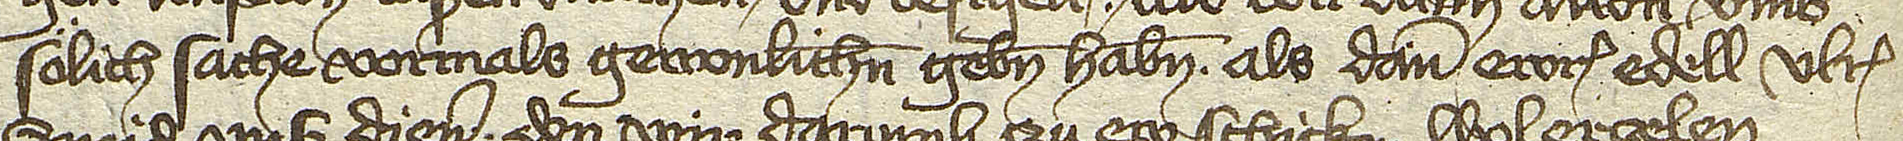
ſölich ſache vormals gewonlichn* gebn* habn* . als dan* ewr* edell vlr*
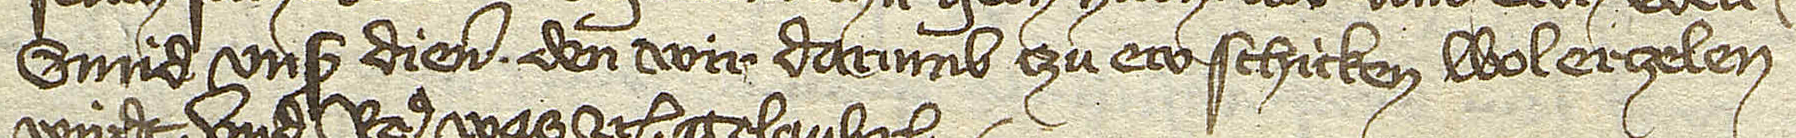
Smid vnſ* dien* den wir darumb cʒu ew ſchicken wol ercʒelen
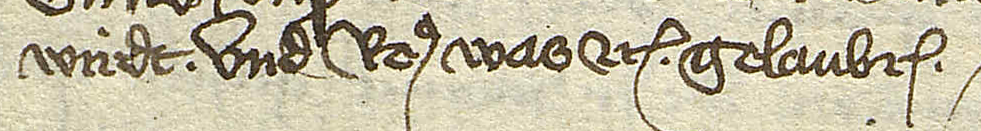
wirdt. Vnd Ro* was ec* . gelaubr* . /
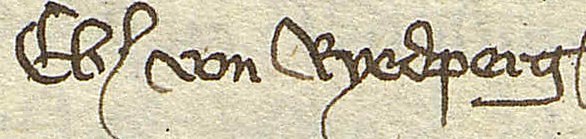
Eb* von Ryedperg*
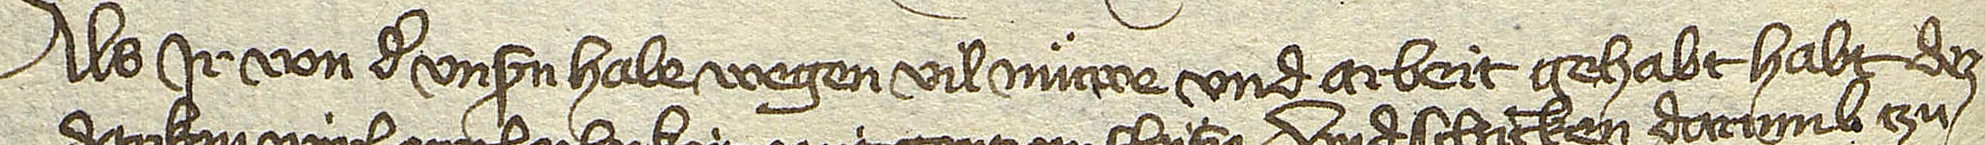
Als Ir von d* vnſ*n habe wegen vil müwe vnd arbeit gehabt habt deʒ
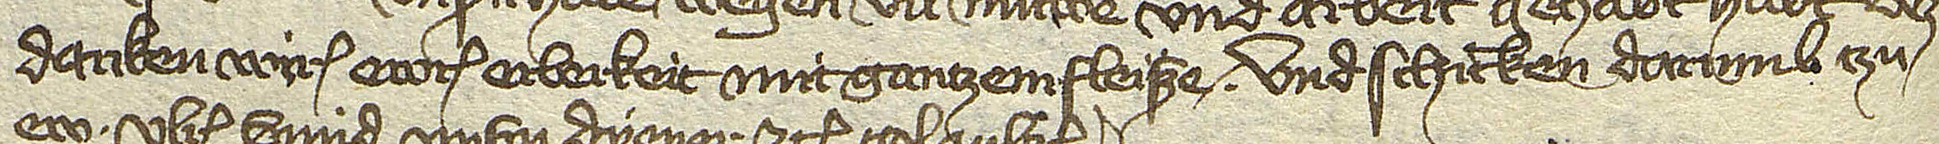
danken wir* ewr* erberkeit mit gancʒem fleiſʒe / . Vnd ſchicken darumb cʒu /
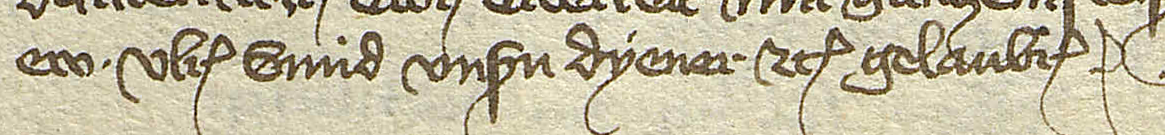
ew . vlr* Smid vnſ*n dyener ec* gelaubr* § .
